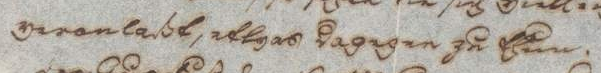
veranlaßt, etwas dagegen zu thun.
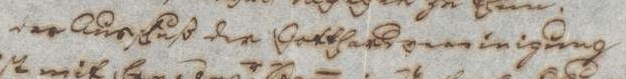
Der Ausschuß der Gotthardvereinigung
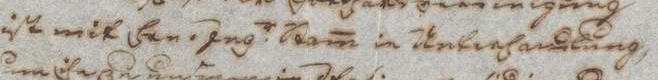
ist mit Hrn. IngrStamm in Unterhandlung,
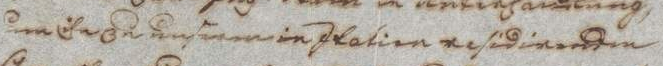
um ihn zu unserm in Italien residirenden
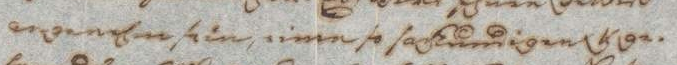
angenehm sein, einen so sachkundigen & ge-
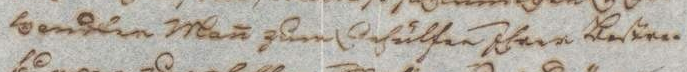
wandten Mann zum Gehülfen Ihrer Bestre-
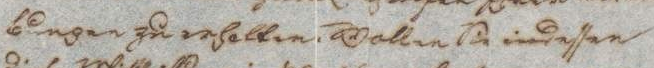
bungen zu erhalten. Wollen Sie indessen
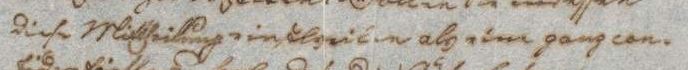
diese Mittheilung einstweilen als eine ganz con-
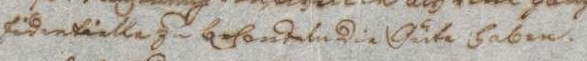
fidentielle zu behandeln die Güte haben.
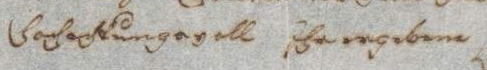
Hochachtungsvoll Ihr ergebene
